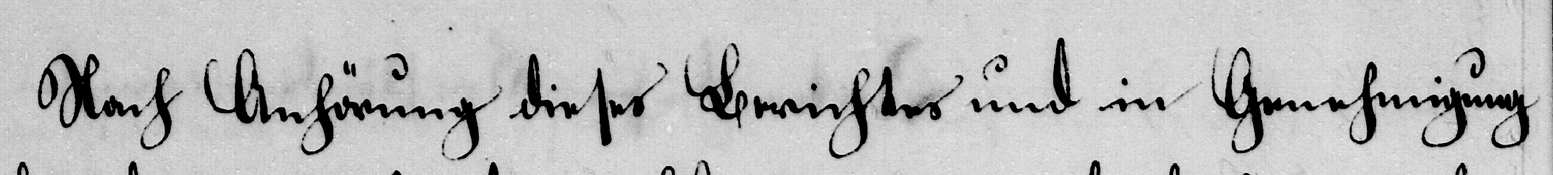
Nach Anhörung dieses Berichtes und in Genehmigung
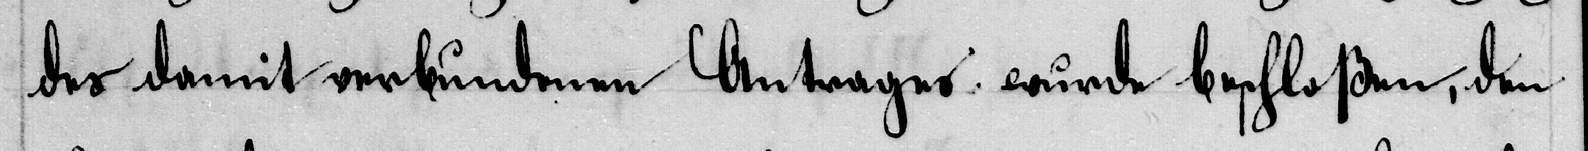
des damit verbundenen Antrages wurde beschloßen, den
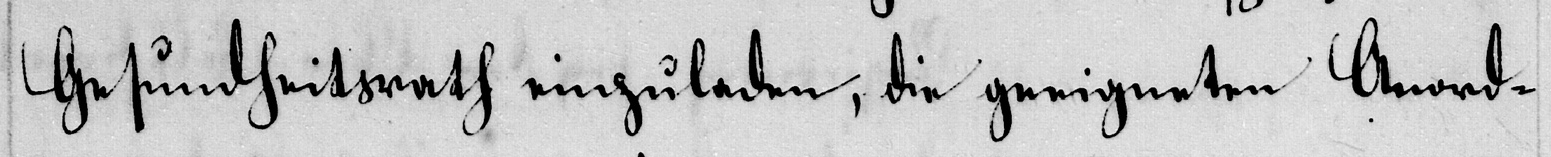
Gesundheitsrath einzuladen, die geeigneten Anord¬
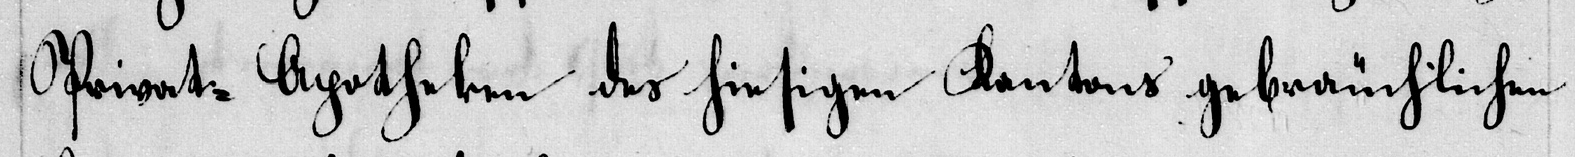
Privat-Apotheken des hiesigen Kantons gebräuchlichen
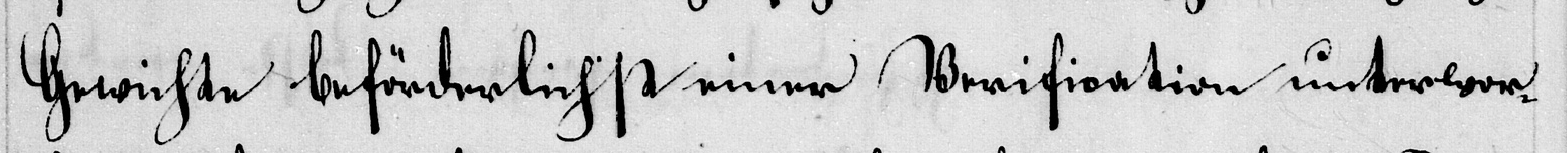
Gewichte beförderlichst einer Verification unterwor¬
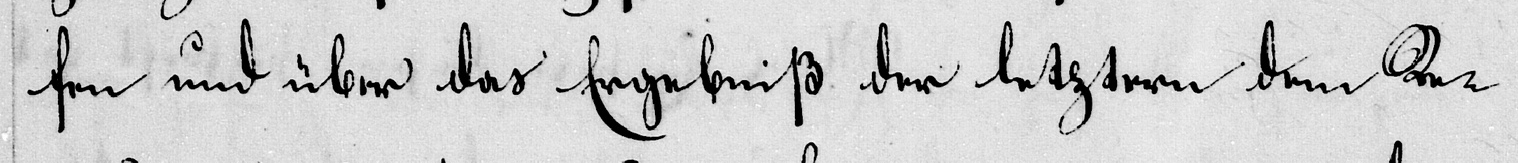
fen und über das Ergebniß der letztern dem Re¬
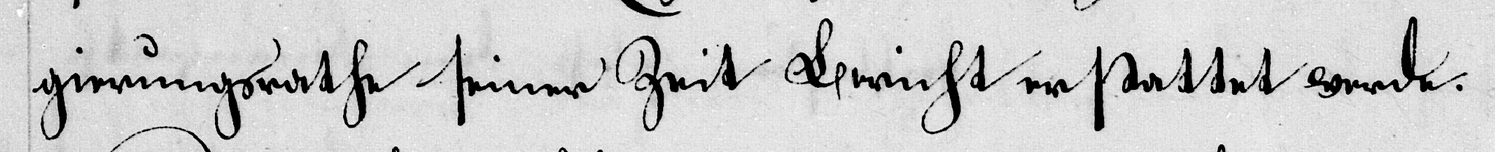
gierungsrathe seiner Zeit Bericht erstattet werde.
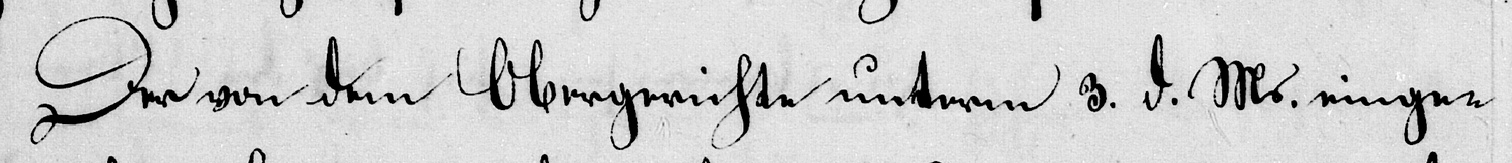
Der von dem Obergerichte unterm 3. d. Ms. einge¬
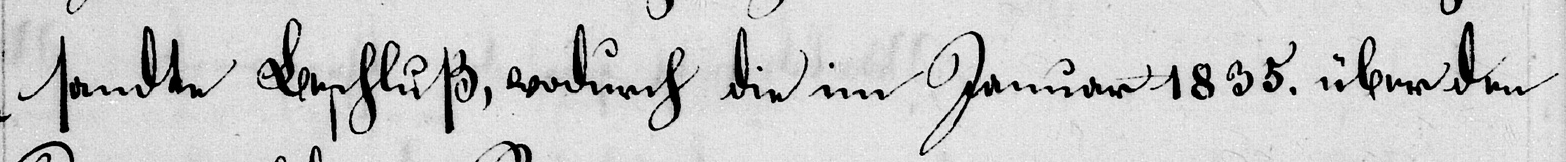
sandte Beschluß, wodurch die im Januar 1835. über den
